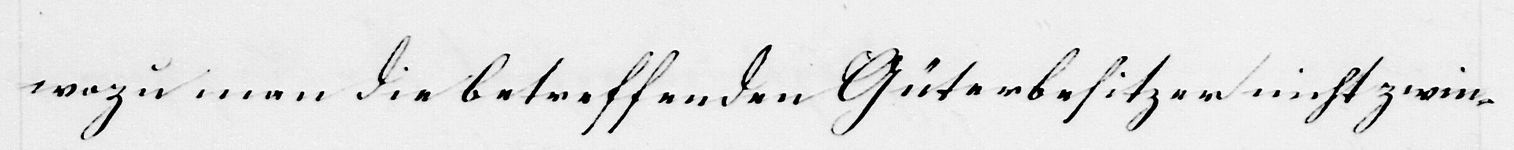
wozu man die betreffenden Güterbesitzer nicht zwin¬
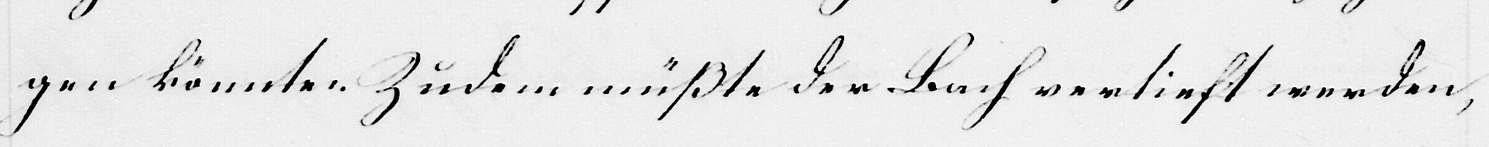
gen könnte. Zudem müßte der Bach vertieft werden,
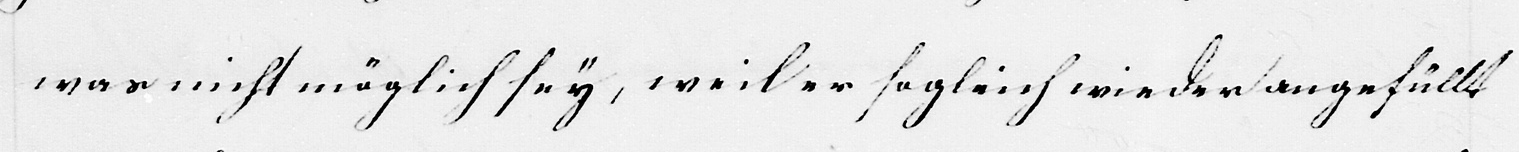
was nicht möglich sey, weil er sogleich wieder angefüllt
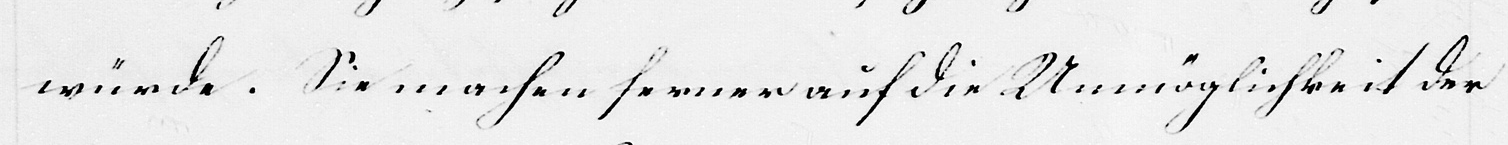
würde. Sie machen ferner auf die Unmöglichkeit der
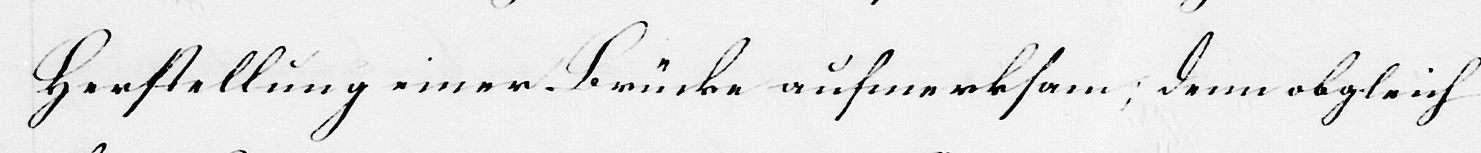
Herstellung einer Brücke aufmerksam; denn obgleich
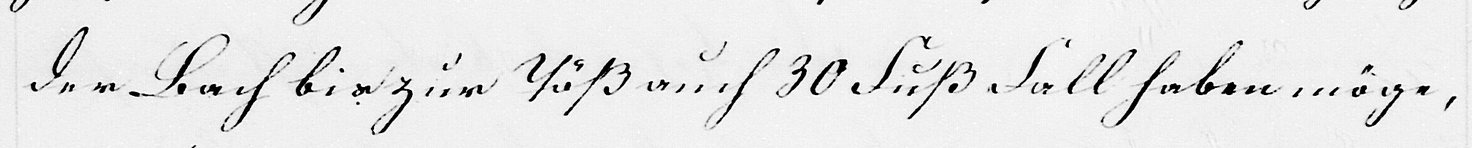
der Bach bis zur Töß auch 30 Fuß Fall haben möge,
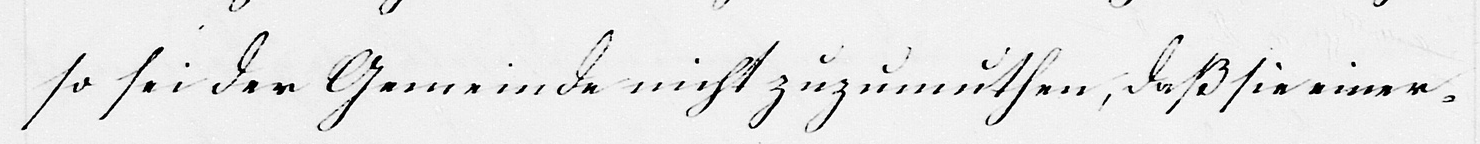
so sei der Gemeinde nicht zuzumuthen, daß sie einer¬
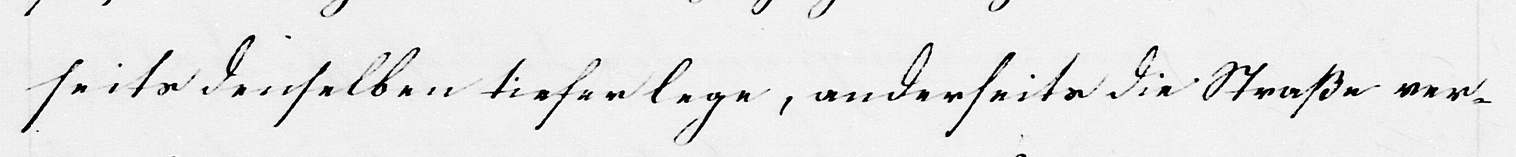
seits denselben tiefer lege, anderseits die Straße ver¬
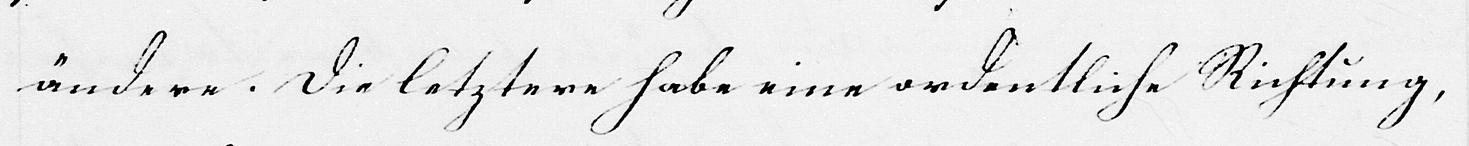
ändere. Die letztere habe eine ordentliche Richtung,
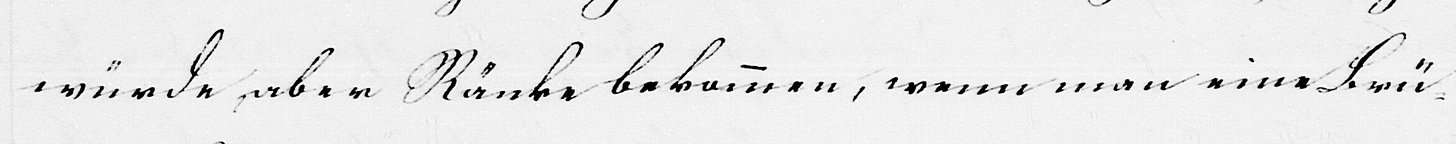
würde aber Ränke bekommen, wenn man eine Brü¬
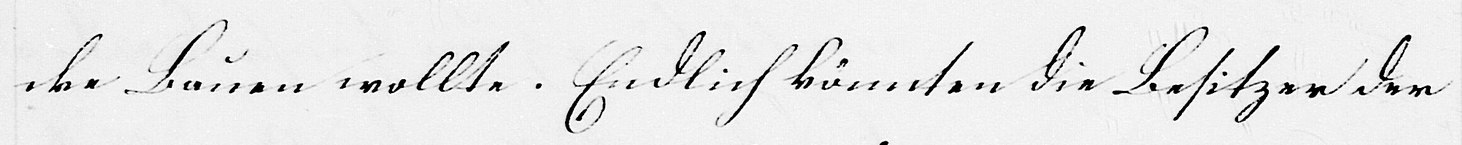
cke Bauen wollte. Endlich könnten die Besitzer der
